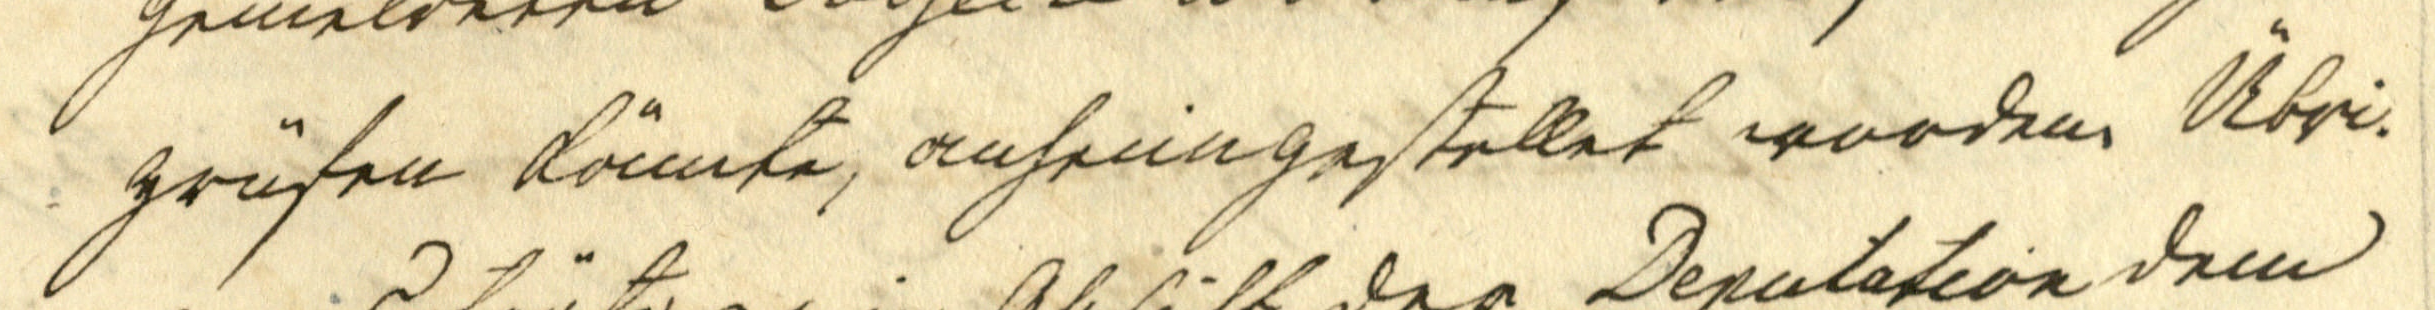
prüfen könnte, anheimgestellet worden. Übri¬
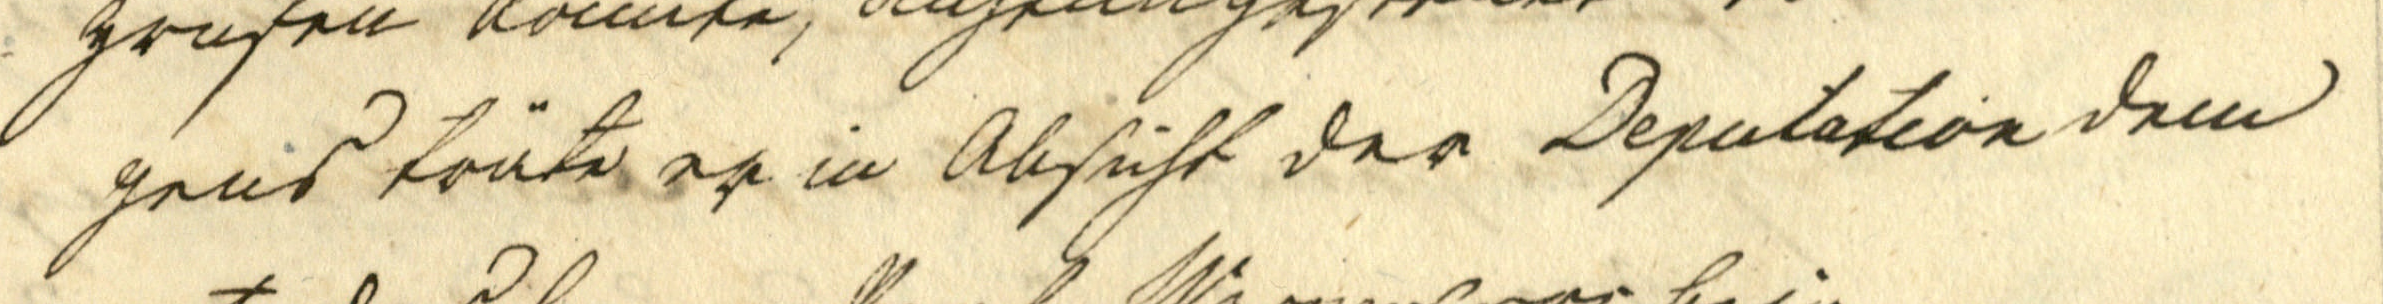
gens träte er in Absicht der Deputation dem
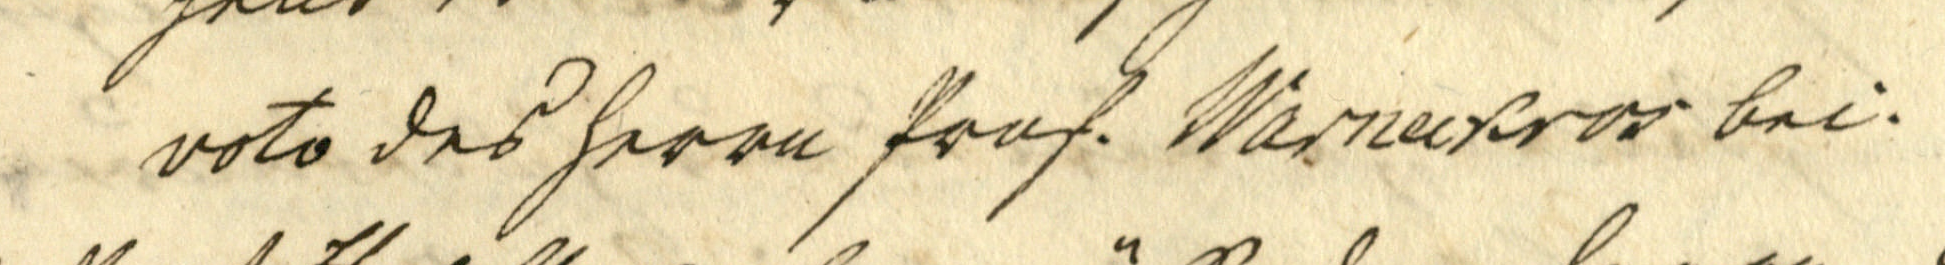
voto des Herrn Prof. Warneckros bei.
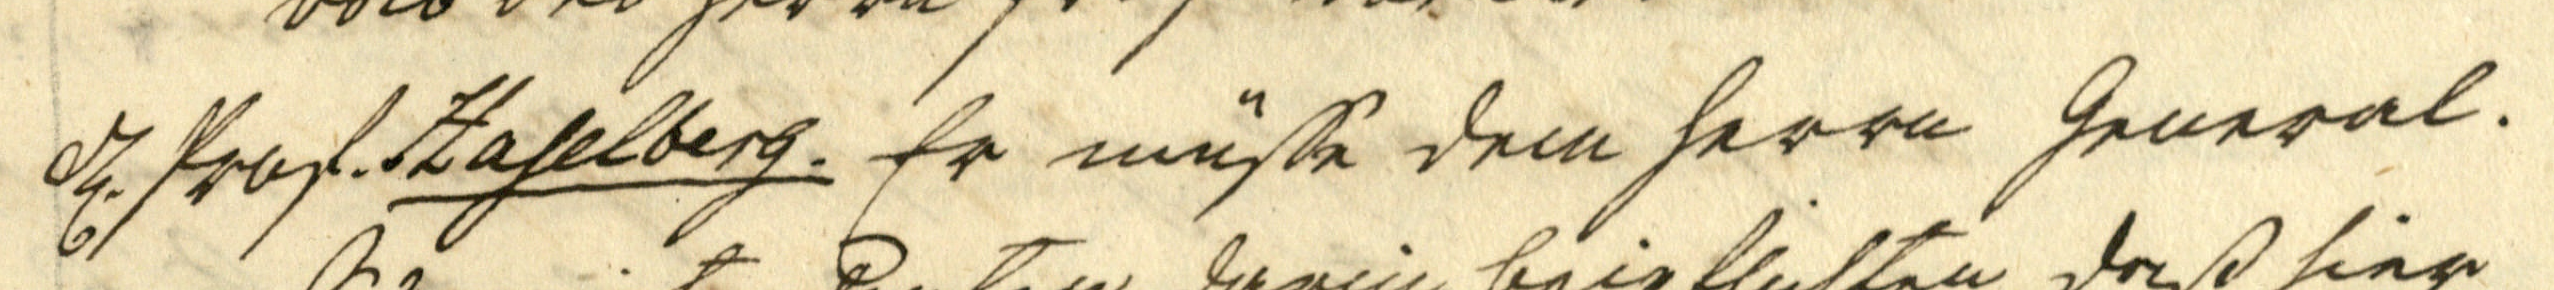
dh. Prof. Haselberg. Er müsse dem Herrn General¬
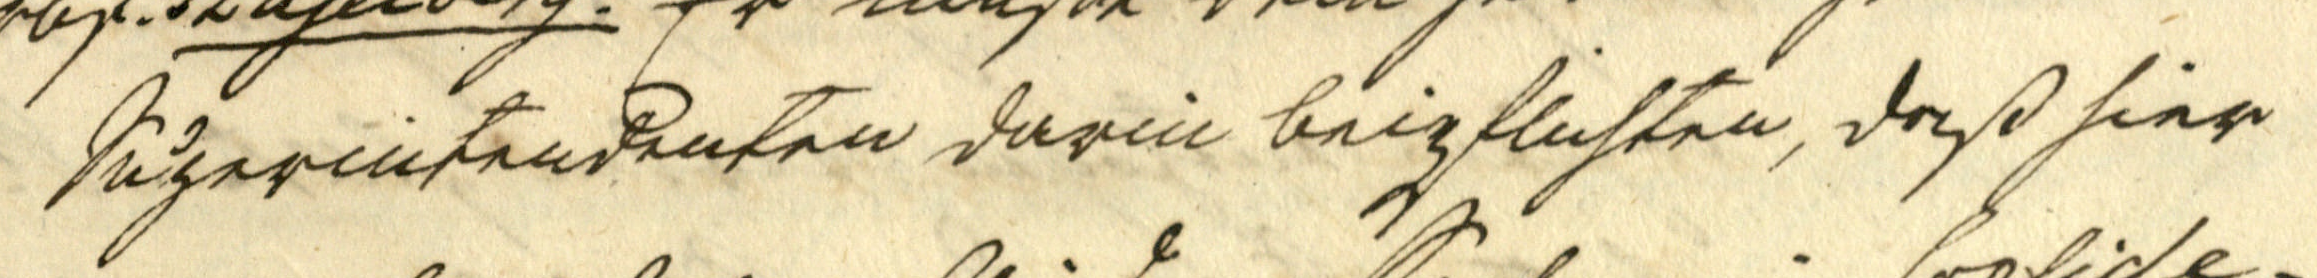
Superintendenten darin beipflichten, daß hier
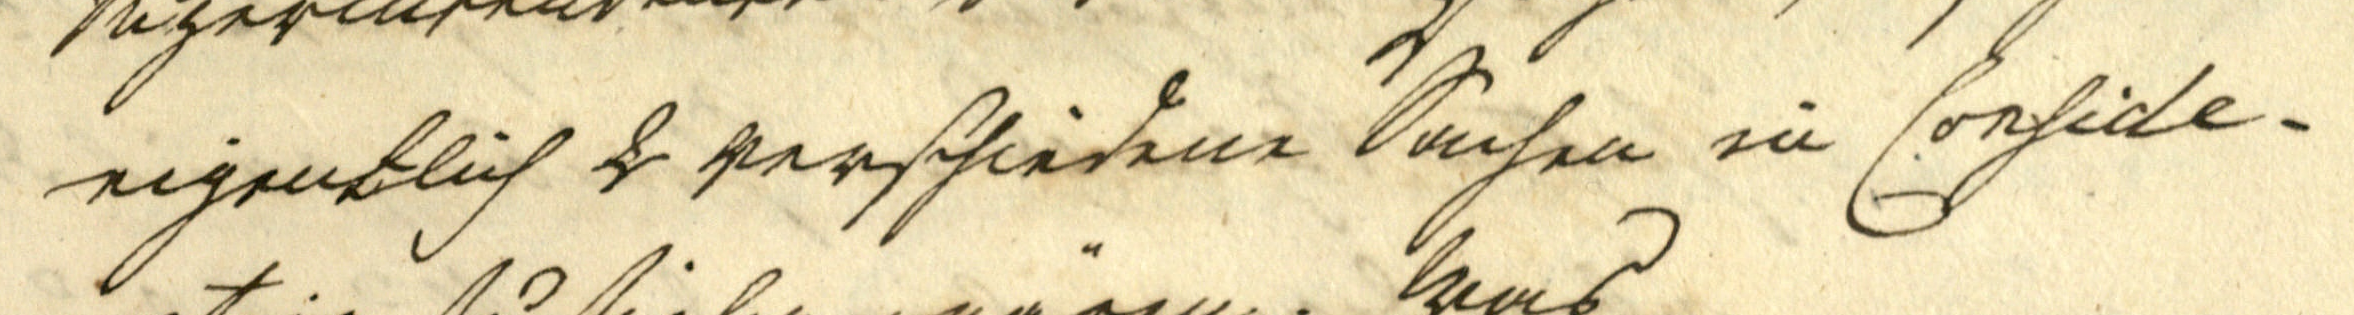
eigentlich 2 verschiedene Sachen in Conside-
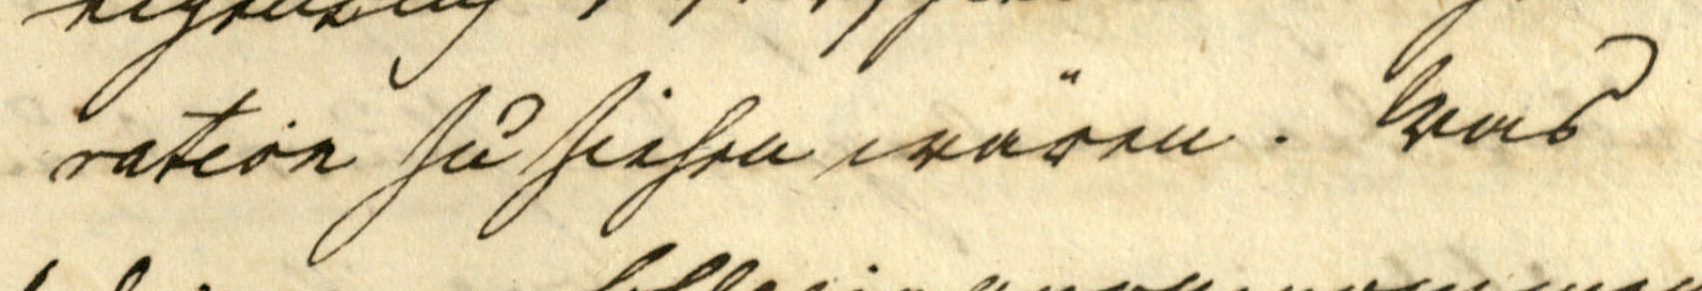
ration zu ziehen wären. Was
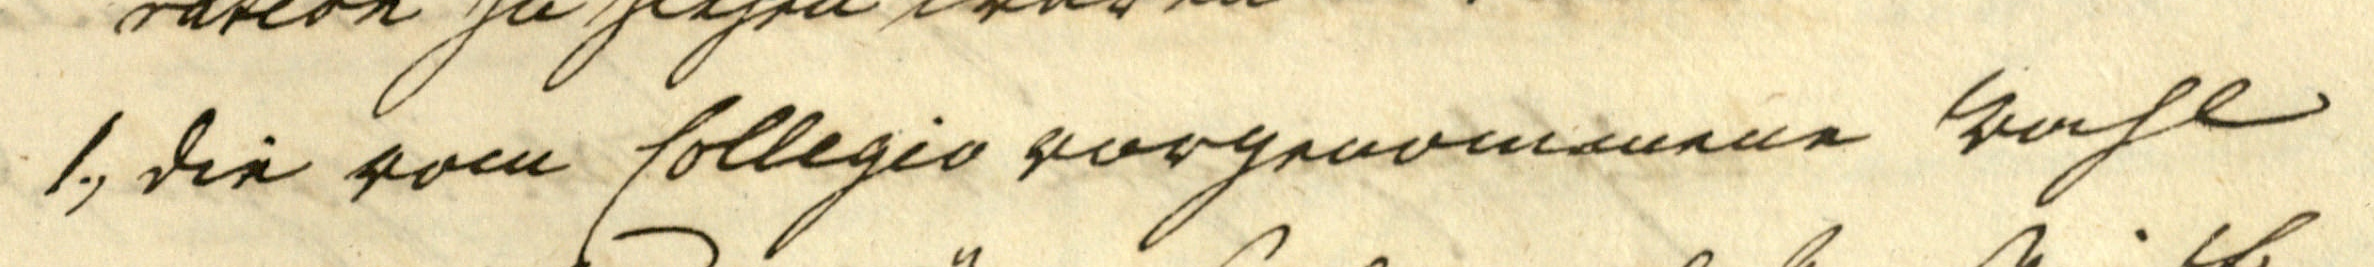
1., die vom Collegio vorgenommene Wahl
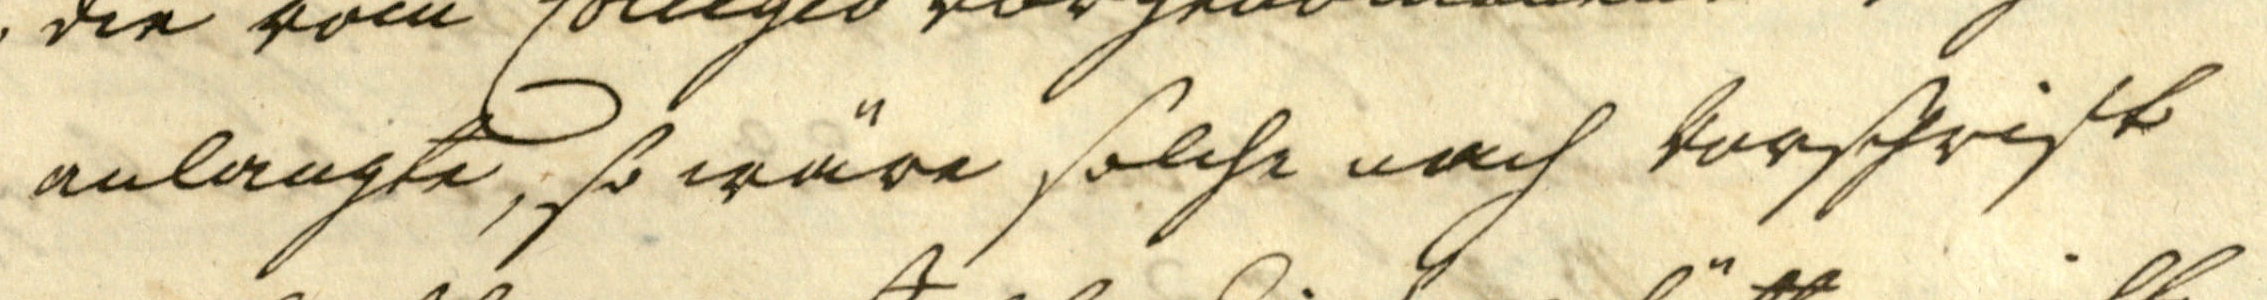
anlangte, so wäre solche nach Vorschrift
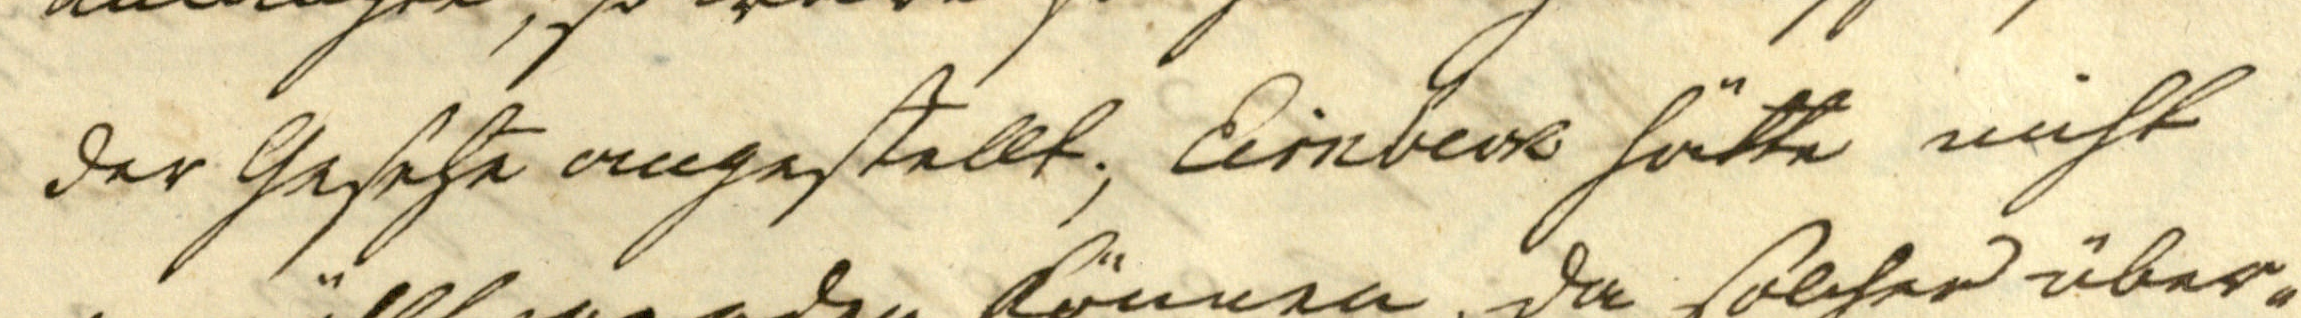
der Gesetze angestellt. Eimbeck hätte nicht
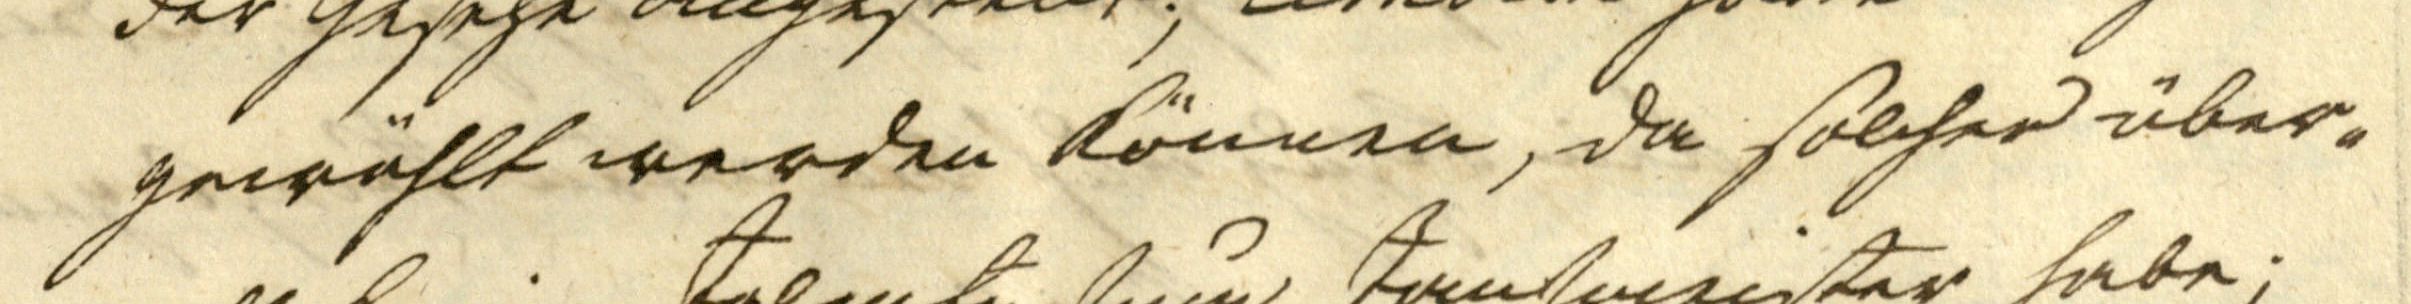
gewählt werden können, da solcher über¬
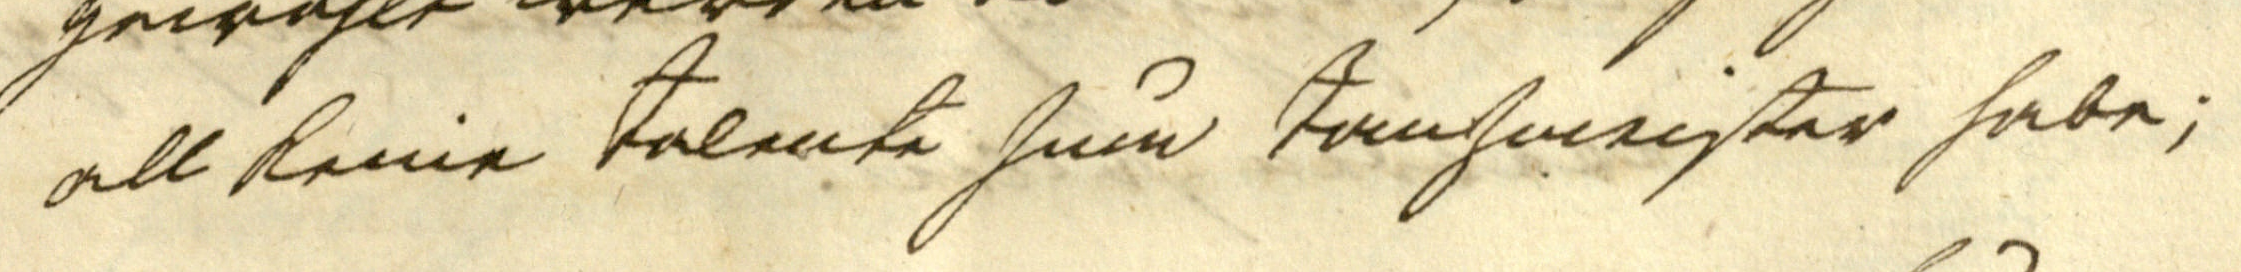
all keine Talente zum Tanzmeister habe;
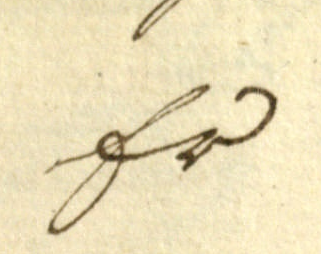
Er
